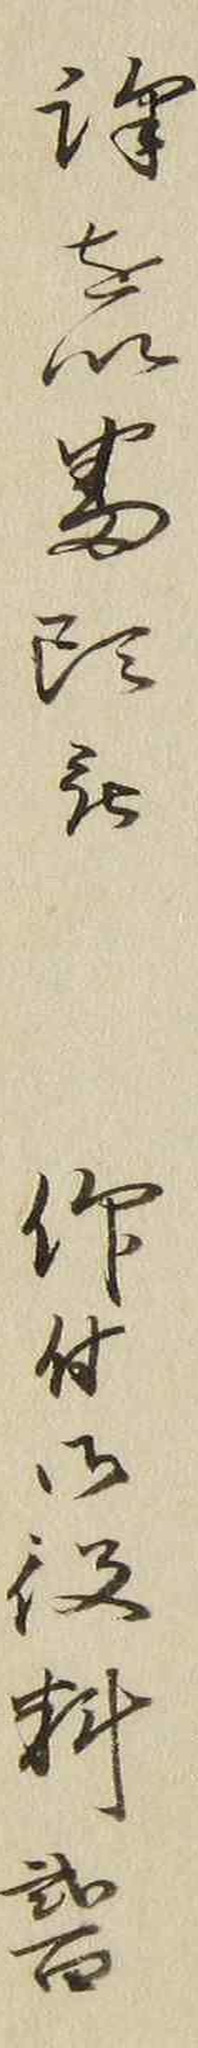譯を以番頭被仰付御役料弐百
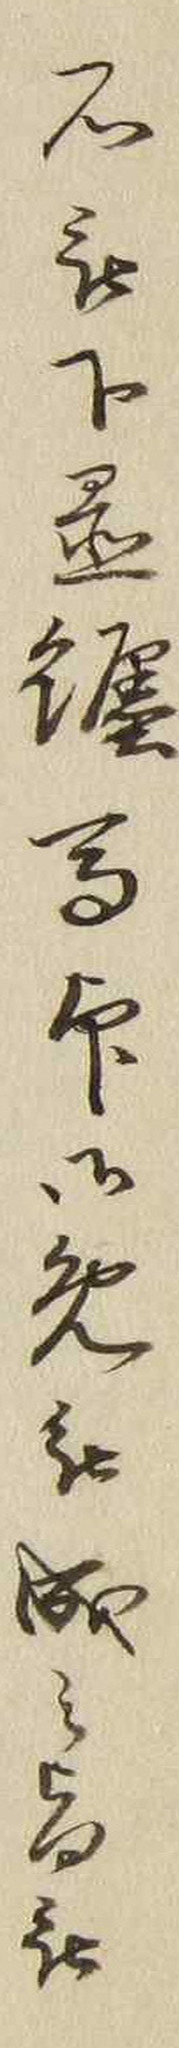石被下置纏馬印御免被成之旨被
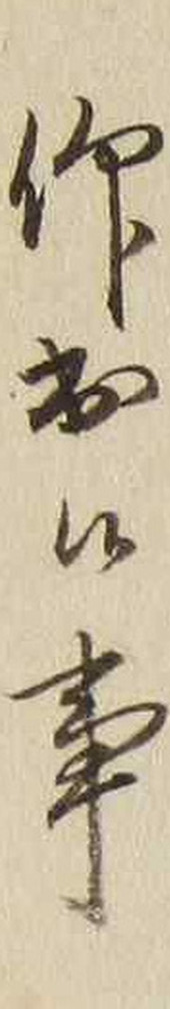仰出候事

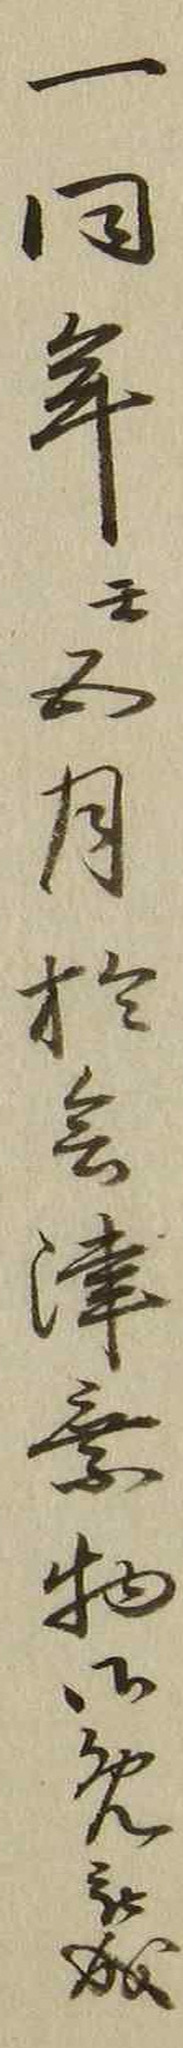一同年閏五月於会津乗物御免被成
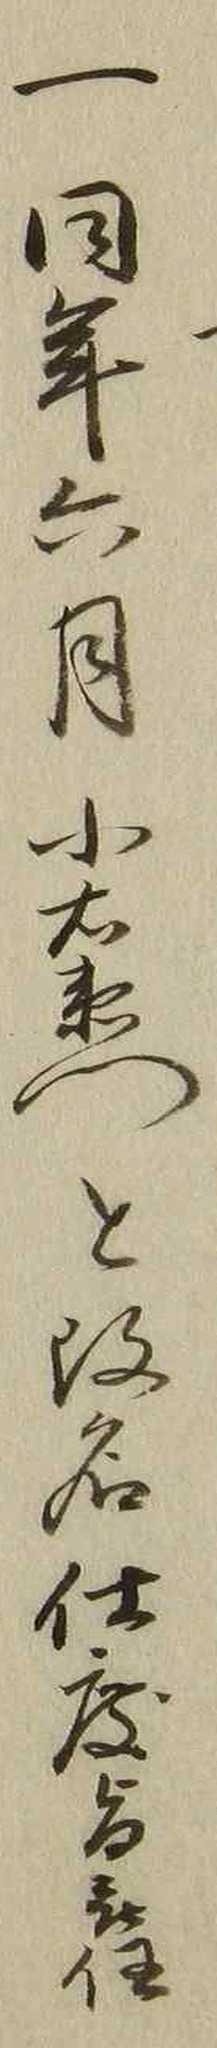一同年六月小右衛門と改名仕度旨被任
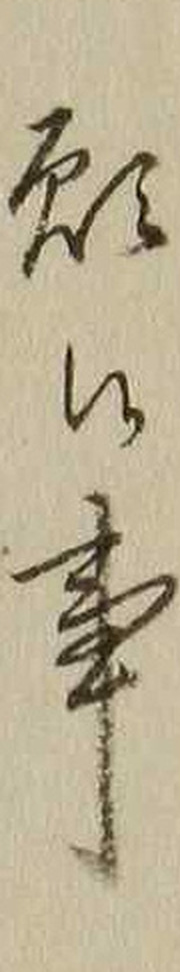願候事
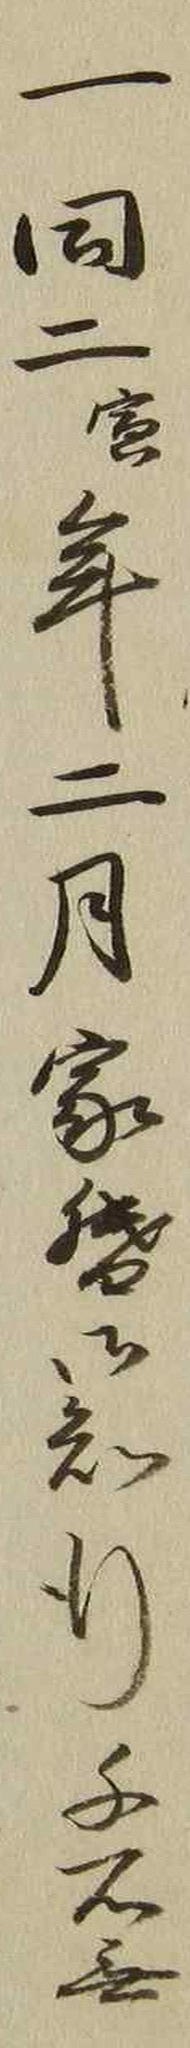一同二寅年二月家督御知行千石無
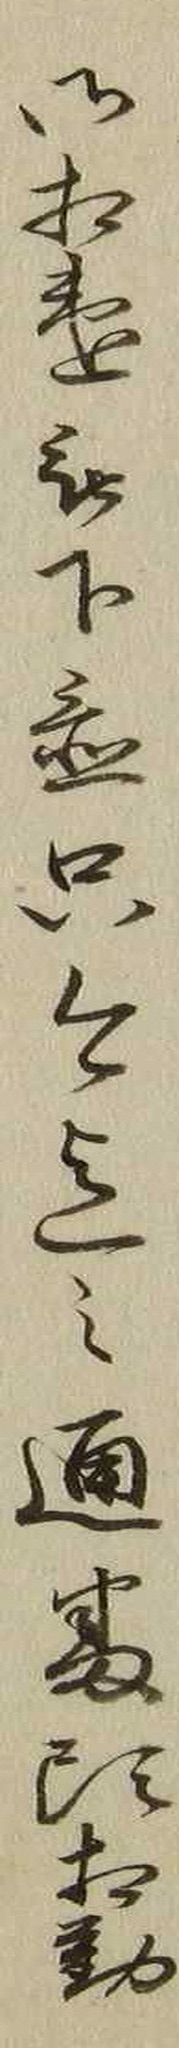御相違被下置只今迄之通番頭相勤
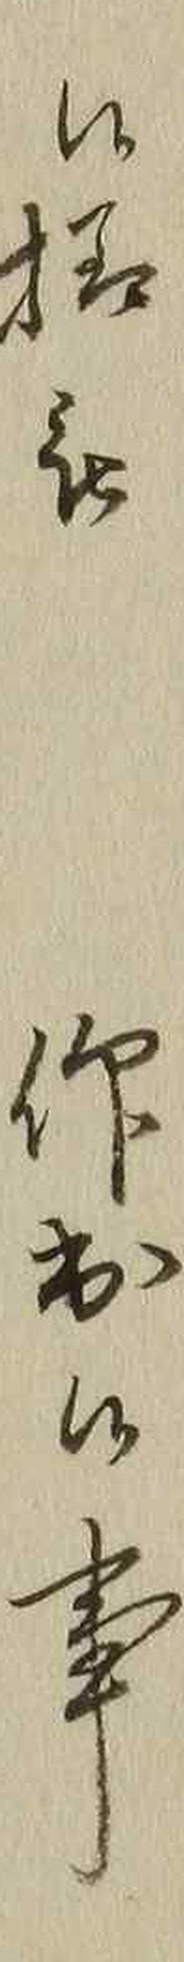候様被仰出候事
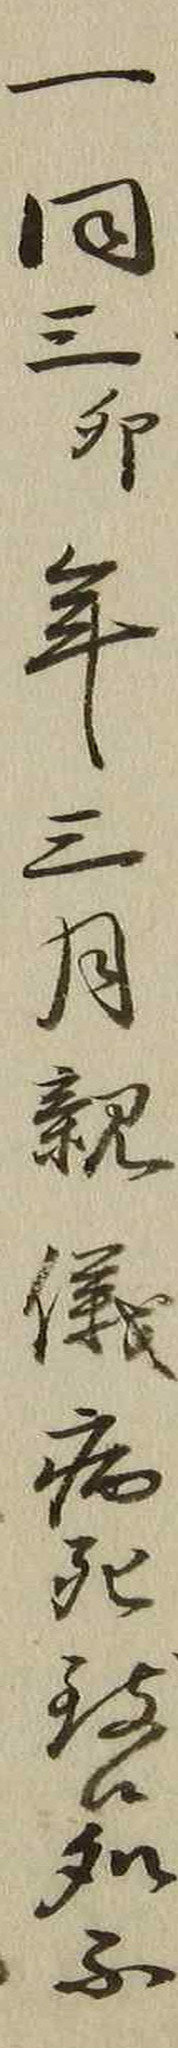一同三卯年三月親儀病死致候処不
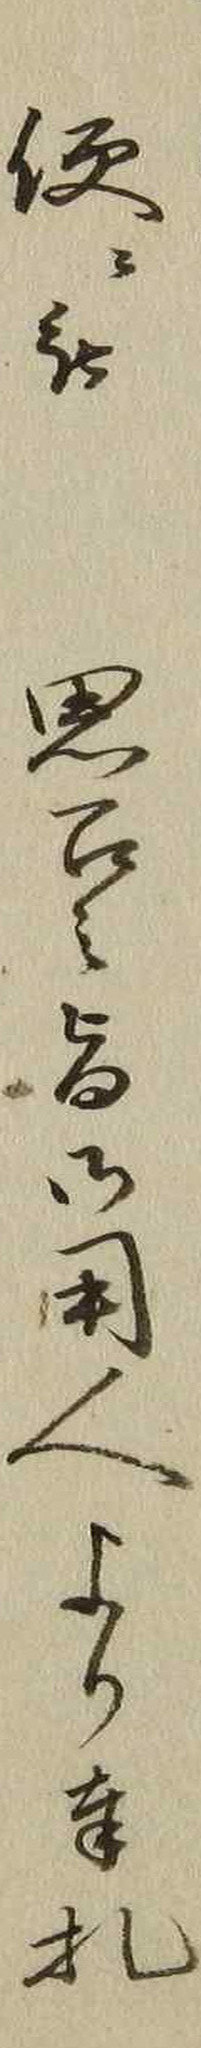便に被思召之旨御用人より奉札
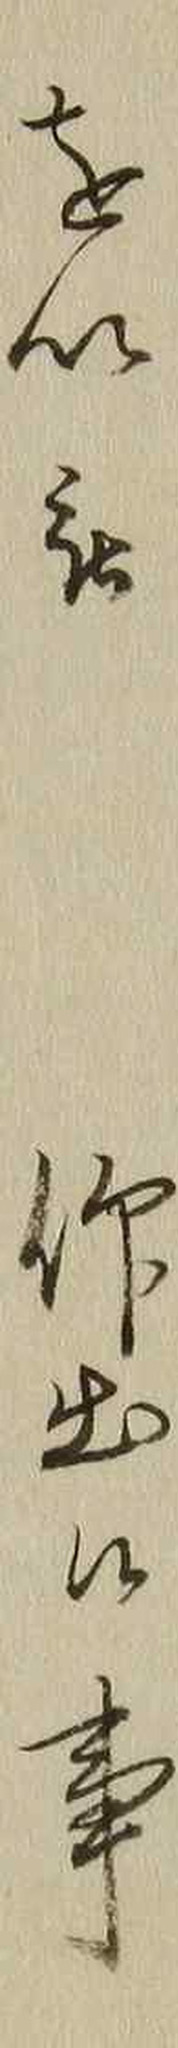を以被仰出候事
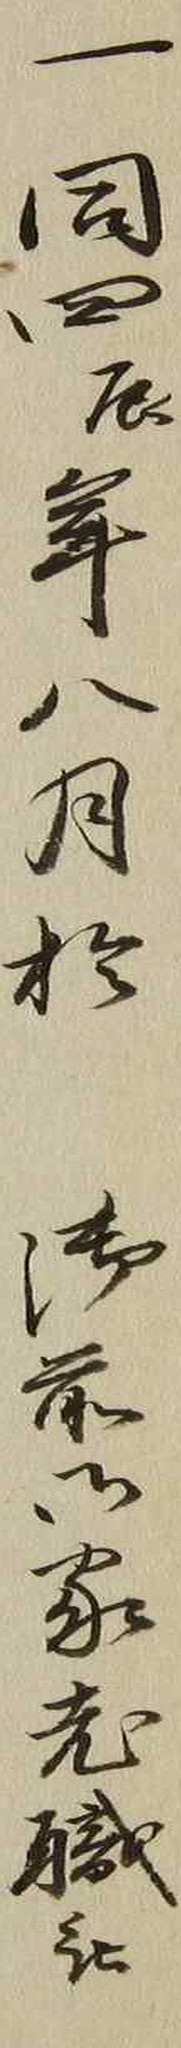一同四辰年八月於御前御家老職被
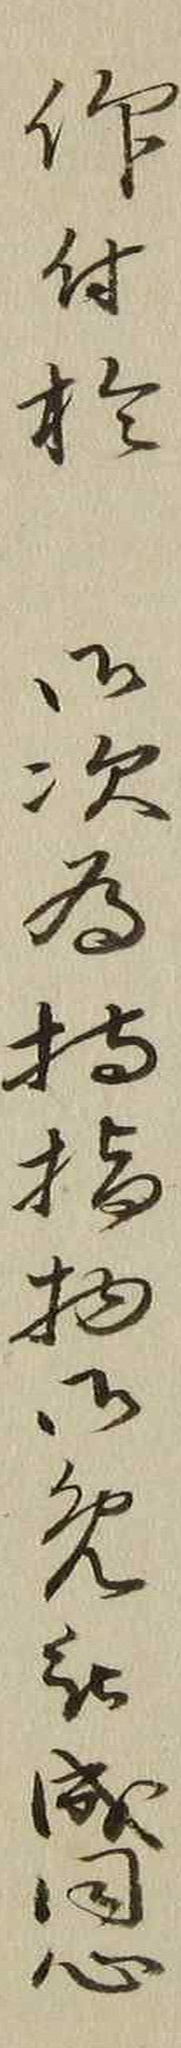仰付於御次為持指物御免被成同心
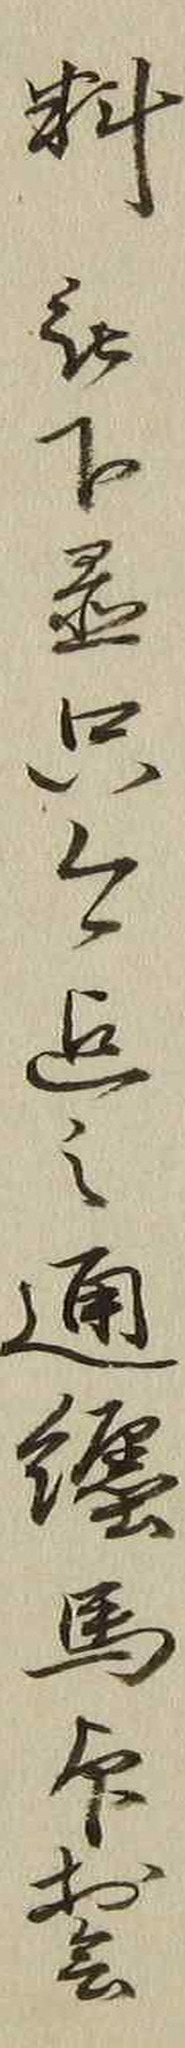料被下置只今迄之通纏馬印於会
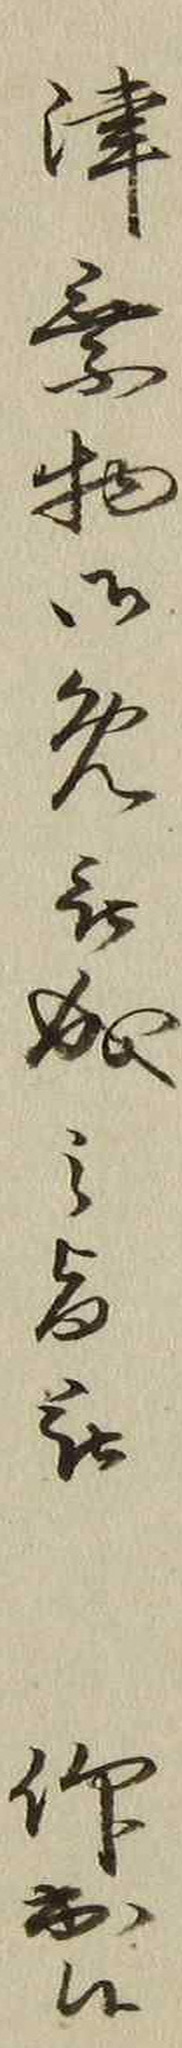津乗物御免被成之旨被仰出候
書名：諸士系譜　巻之133　た之部9
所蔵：会津若松市立会津図書館
